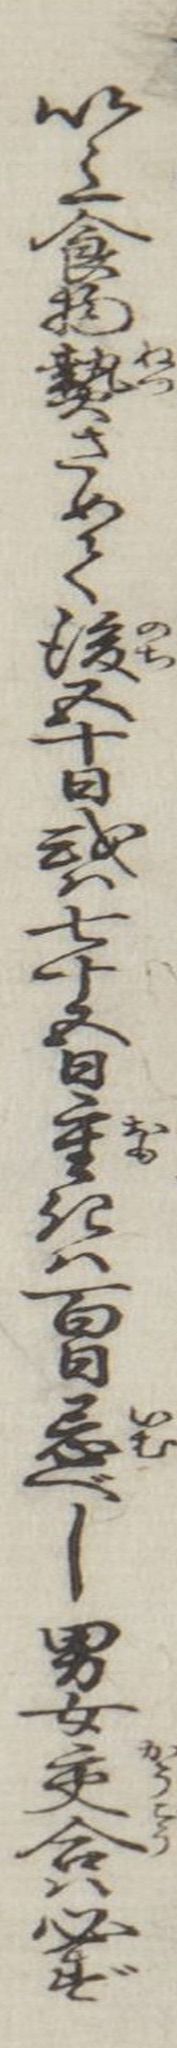以上食物熱さめて後五十日或は七十五日重きは百日忌べし男女交合は必ず
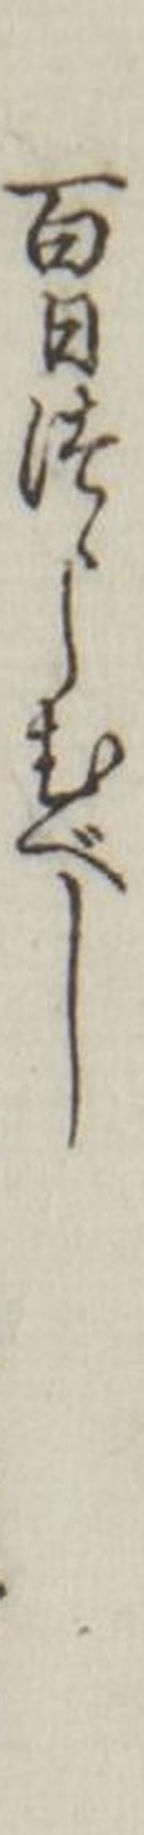百日つゝしむべし
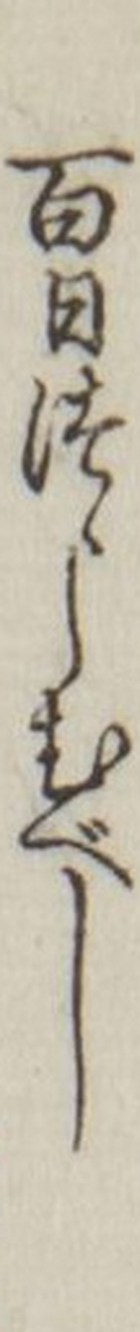百日つゝしむべし
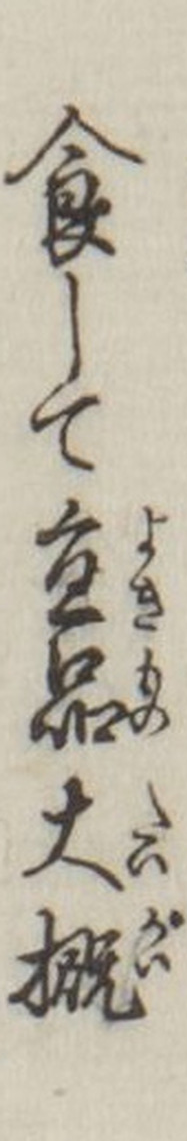食して宜物大概
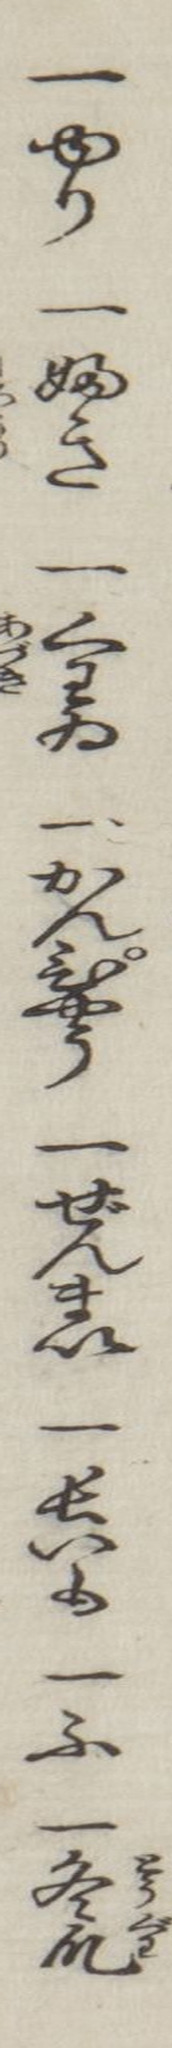一ゆり一ふき一くわゐ一かんぴやう一ぜんまい一長いも一ふ一冬瓜
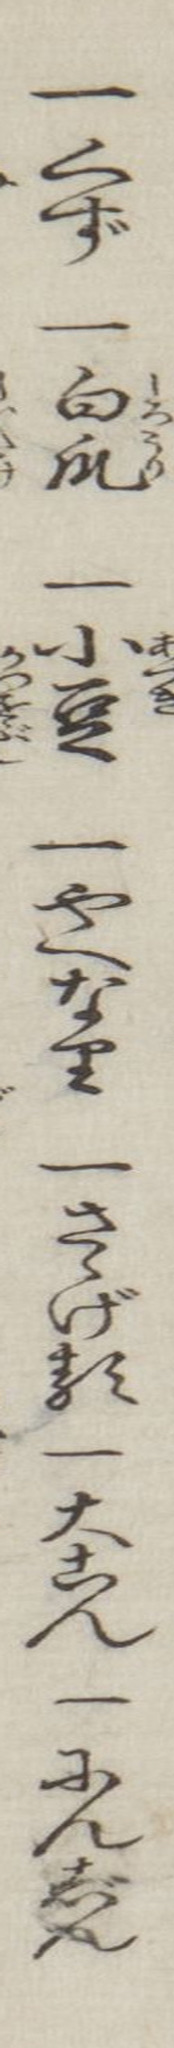一くず一白瓜一小豆一やへなり一さゝげ類一大根一にんじん
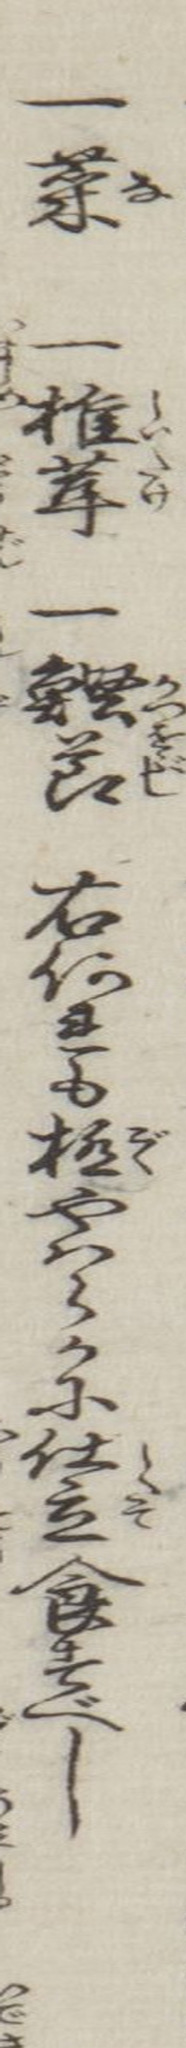一菜一椎茸一鰹節右何れも極やはらかに仕立食すべし
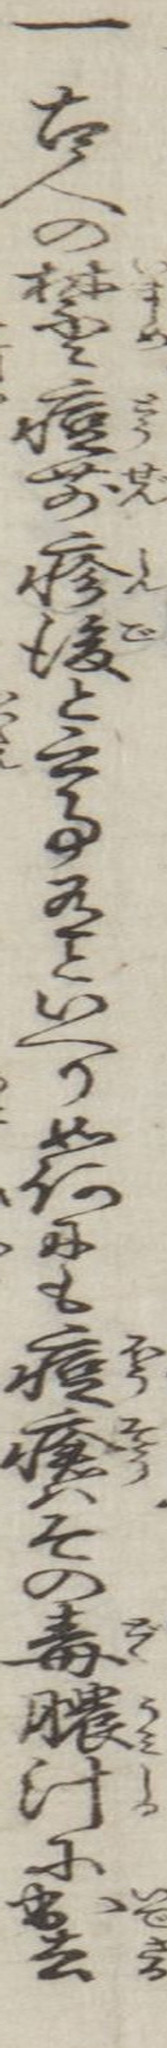一古人の禁に痘前疹後と言事有といへり如何にも疱瘡はその毒膿汁に出去
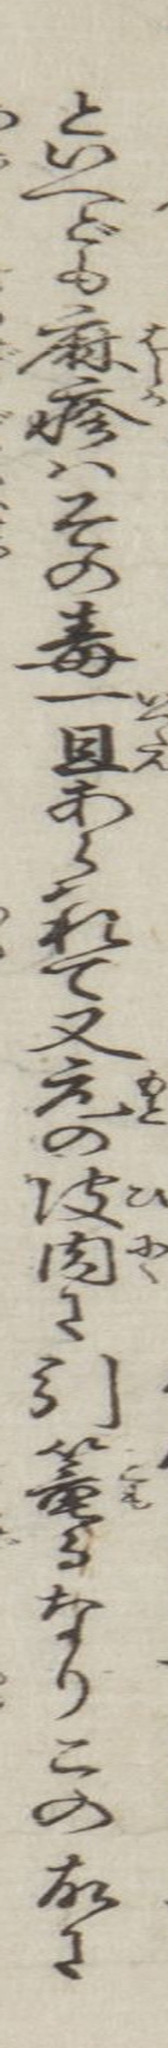といへども麻疹はその毒一旦あらはれて又元に皮肉に引篭るなりこの故に
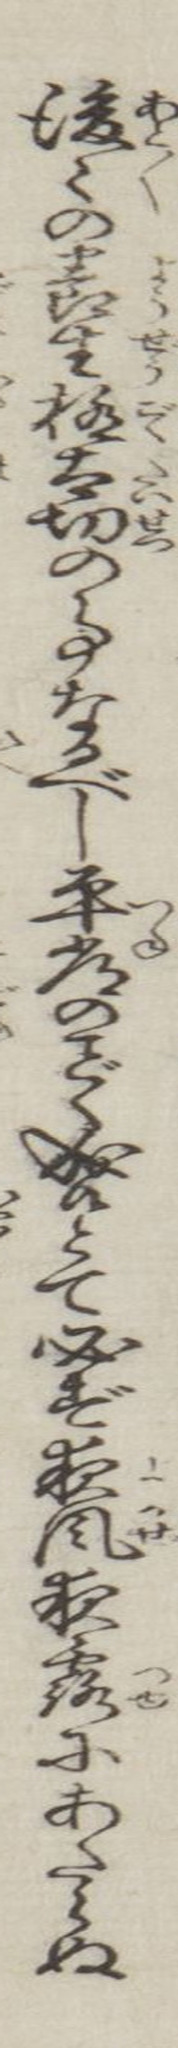後々の養生極大切の事なるべし平常のごとく成候とて必ず夜風夜露にあたらぬ
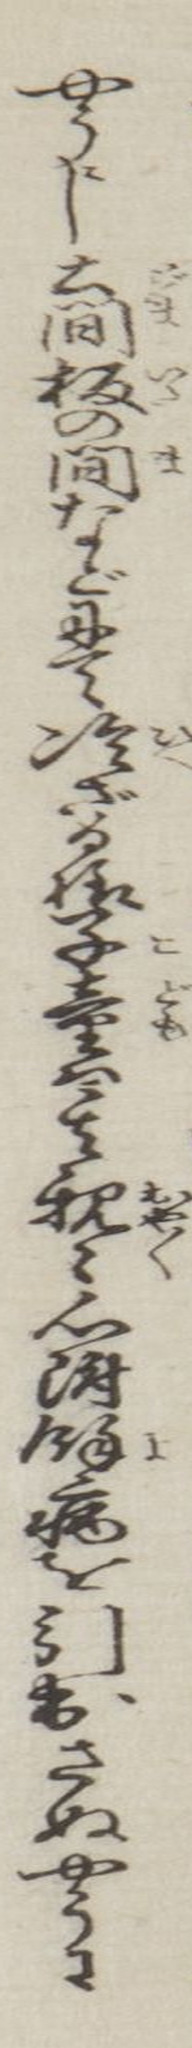やうにし土間板の間などにて冷ざる様子童は其親々心付余病を引出さぬやうに
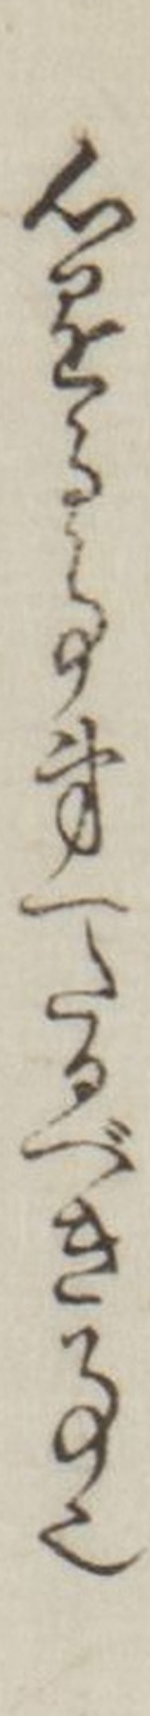心懸る事第一たるべき事也
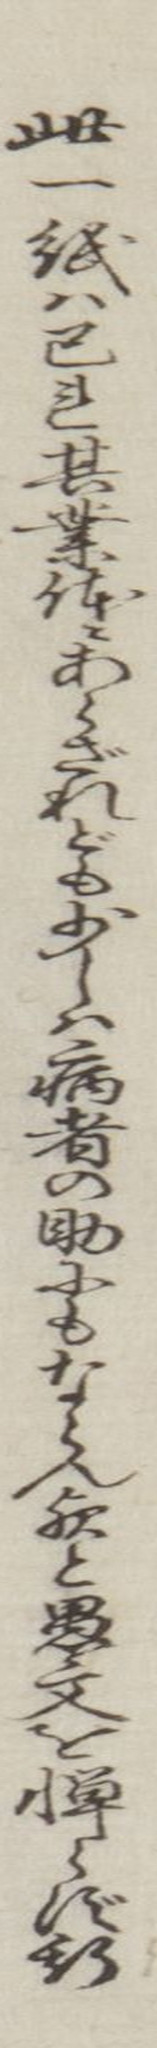此一紙は己れ其業体にあらざれども少しは病者の助にもならんかと愚文を憚らず斯
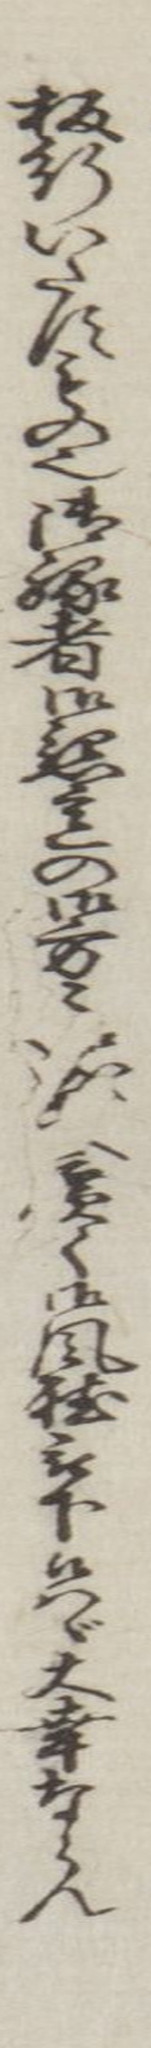板行いたすもの也御縁者御懇意の御方々広く御風聴被下候はゞ大幸ならん
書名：痲疹養生法
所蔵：あいおいニッセイ同和損保株式会社
